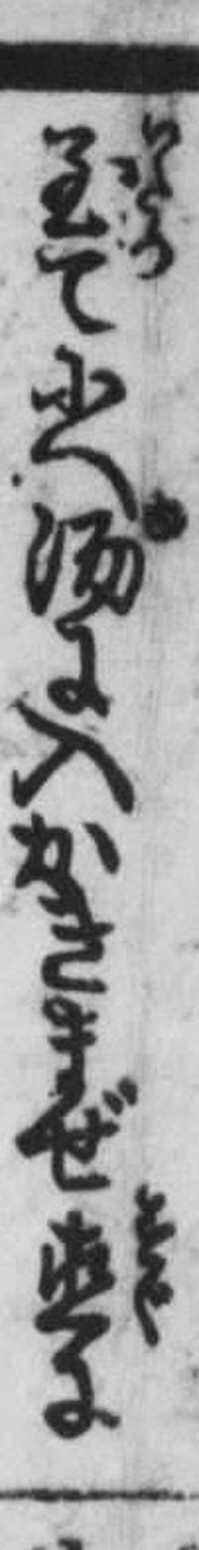至てにへ湯に入かきまぜ直に
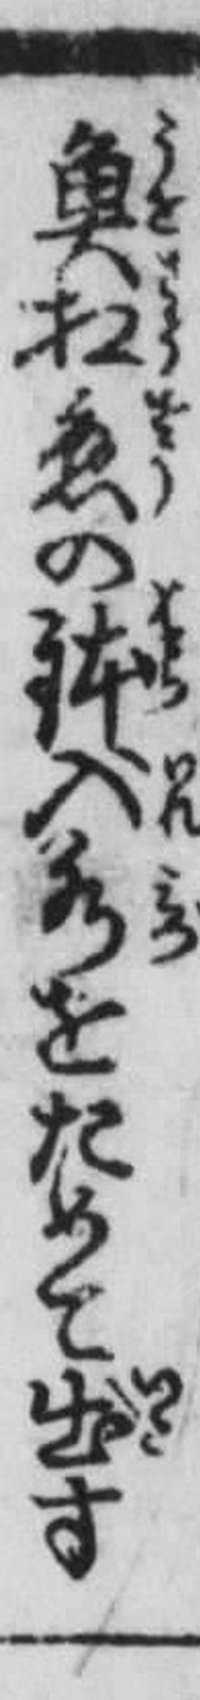魚相応の鉢へ入水をためて出す
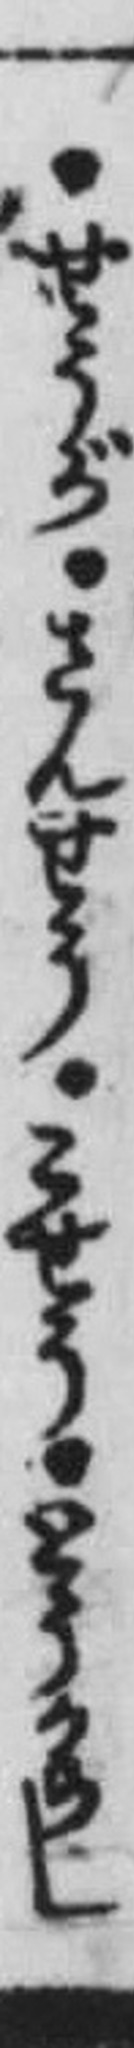・せうが・さんせう・こせう・とうからし
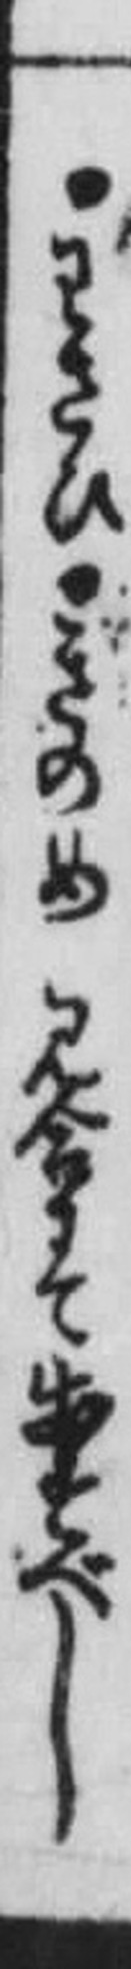・わさひ・きのめ見合にて出すべし
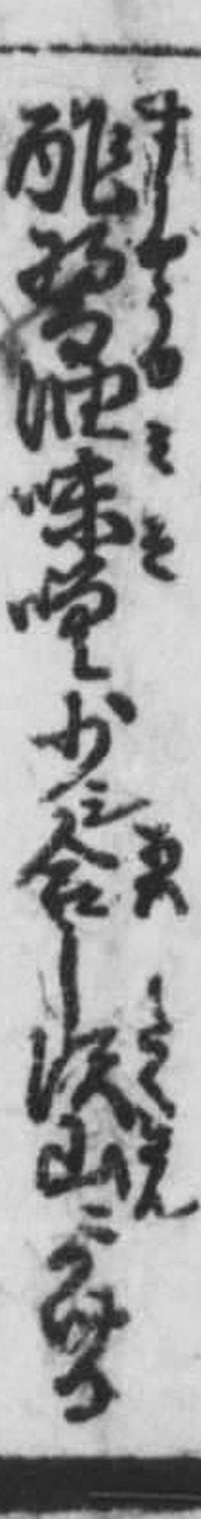酢醤油味噌少し合し沢山にかける
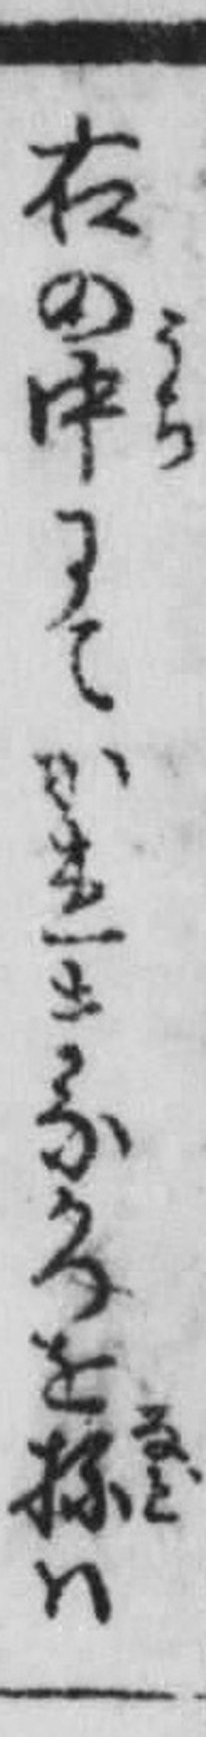右の中にてかきまなかつを抔は
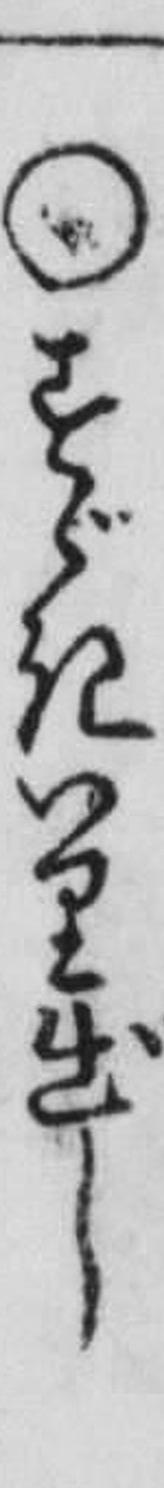○すゞきいり出し
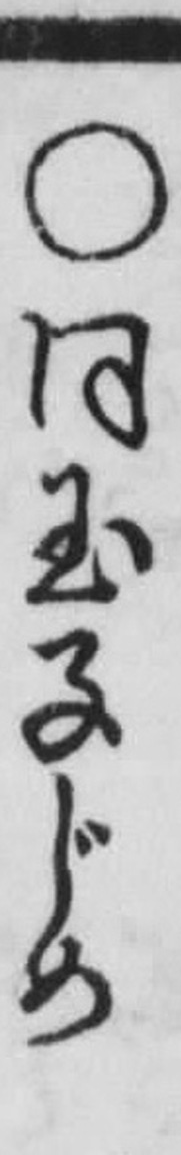○同玉子じめ
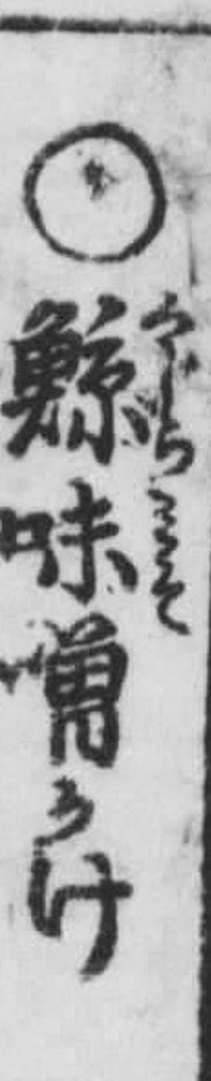○鯨味噌かけ
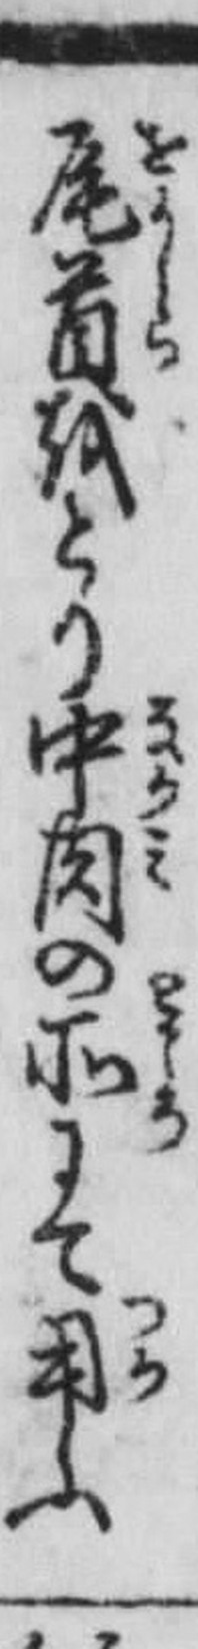尾首をとり中肉の所にて用ふ
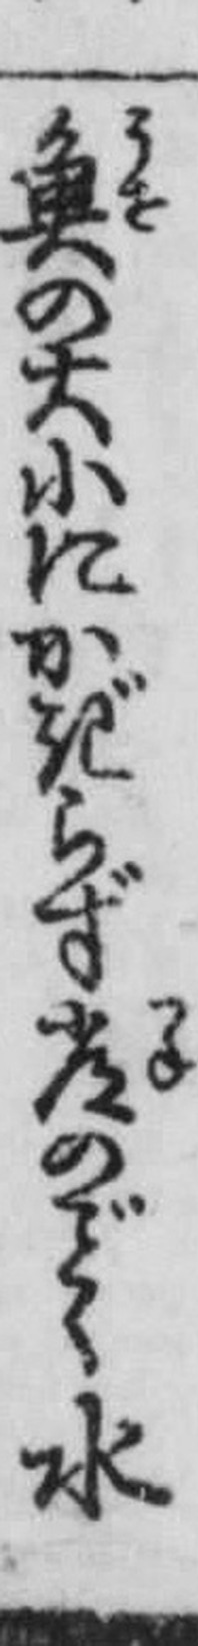魚の大小にかぎらず常のごとく水
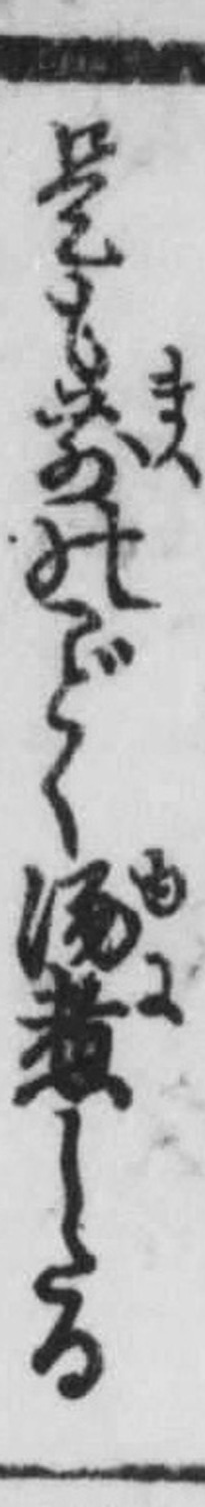是も前のごとく湯煮したる
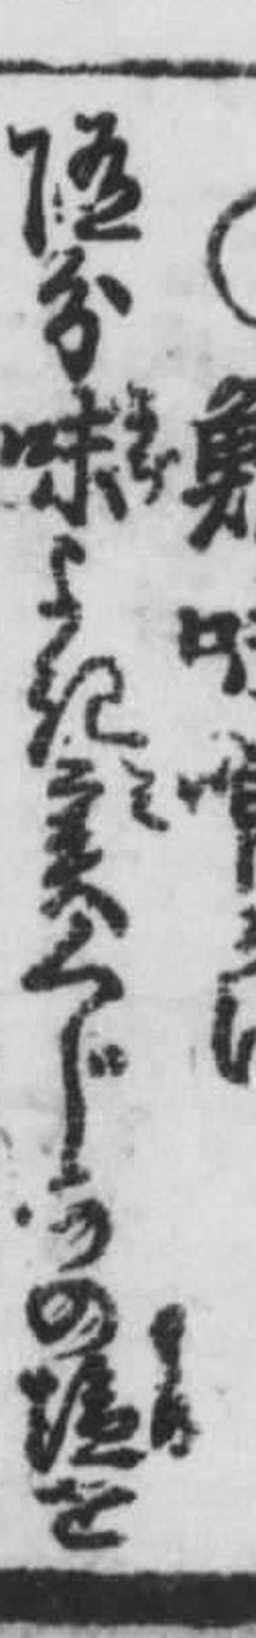随分味よき美くじらの塩を
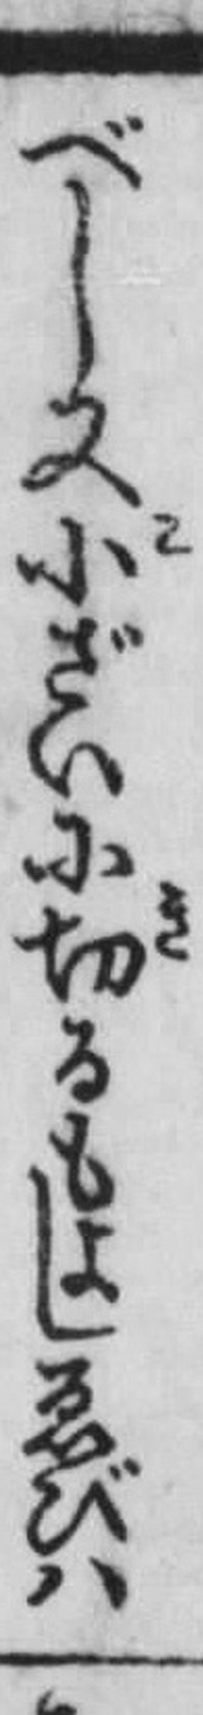べし又小ざいに切るもよしゑびは
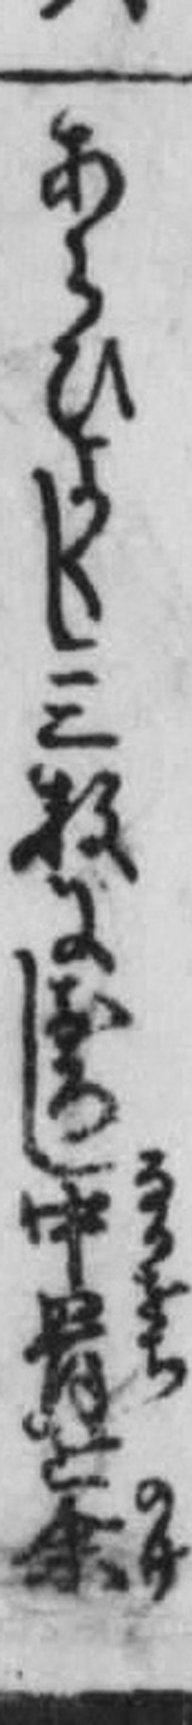あらひよくし三枚におろし中骨を余
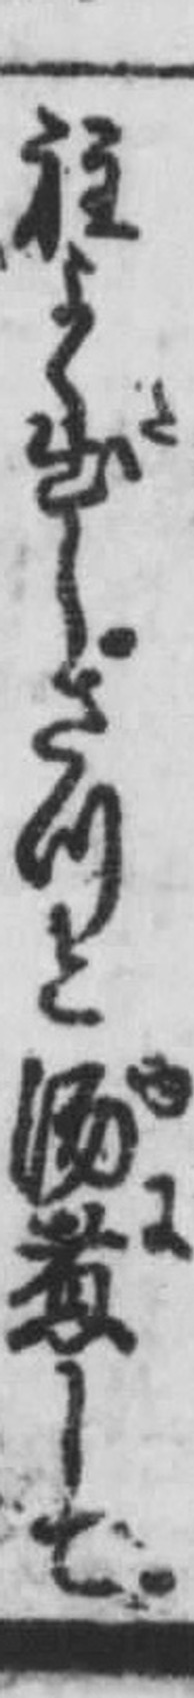程よく出しさつと湯煮して
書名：精進魚類間合料理/早速庖丁
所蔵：大阪府立大学学術情報センター 国文学研究資料館
